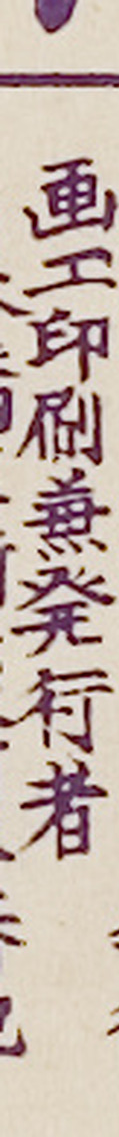画工印刷兼発行者
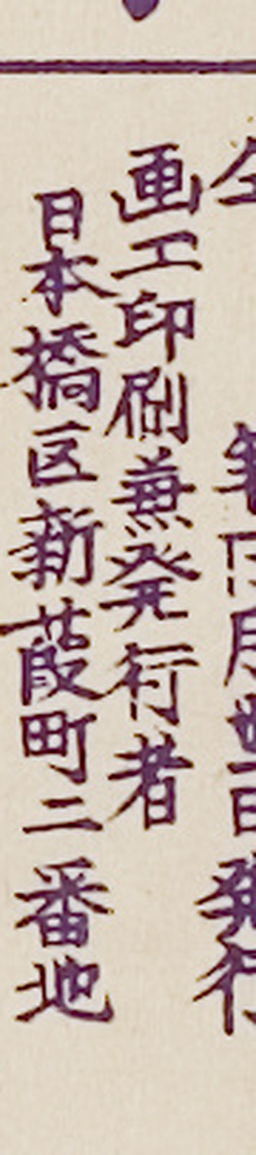日本橋区新両葭町二番地
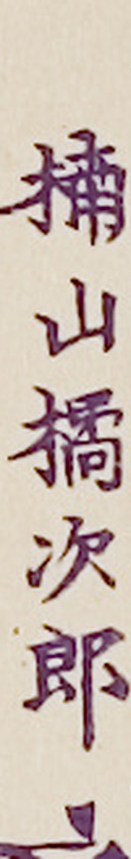楠山橘次郎
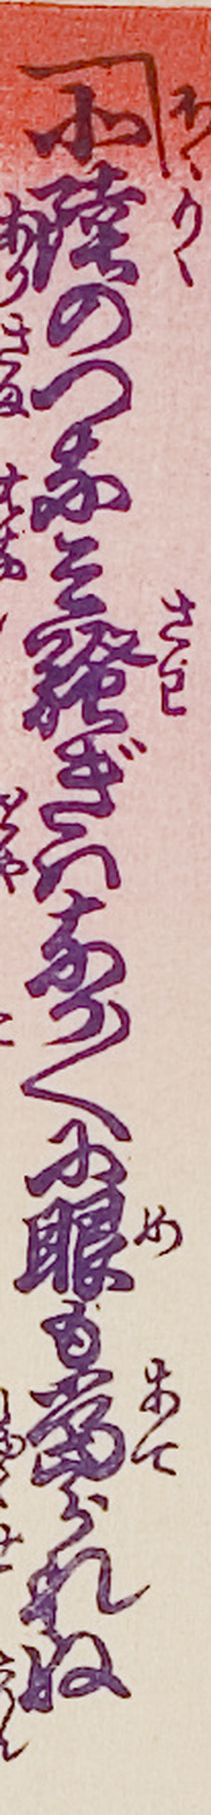〽北陸のつなみ騒ぎはなか〳〵に眼も当られぬ
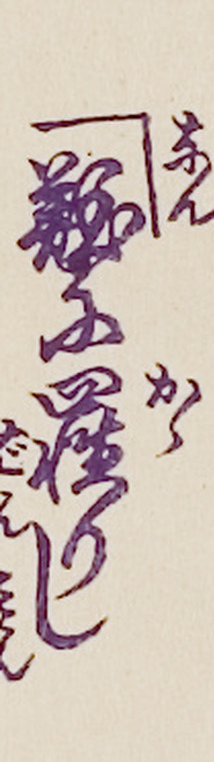〽難に罹りし
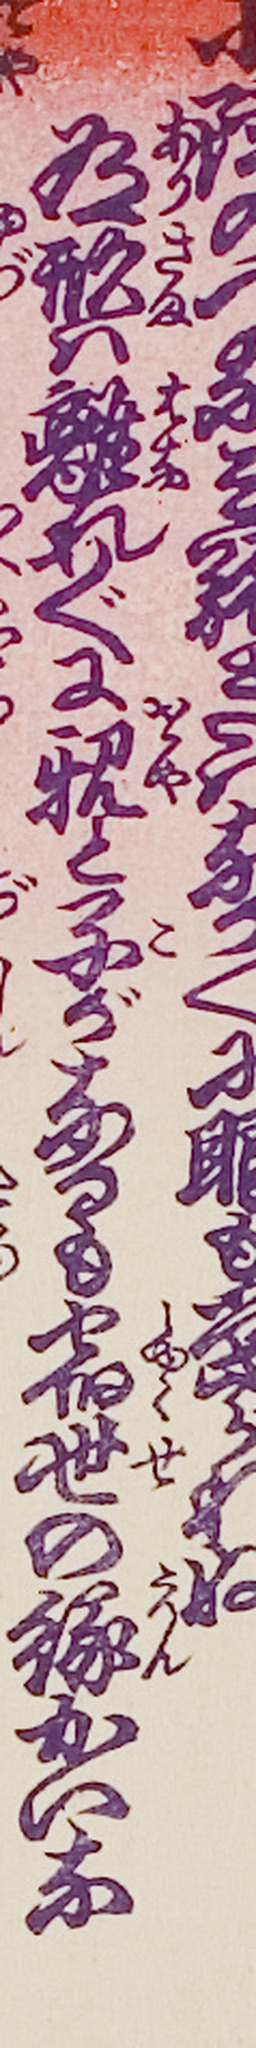有形は離れ〴〵に親と子がなるも宿世の縁かいな
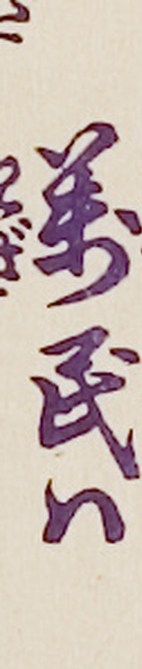万民は
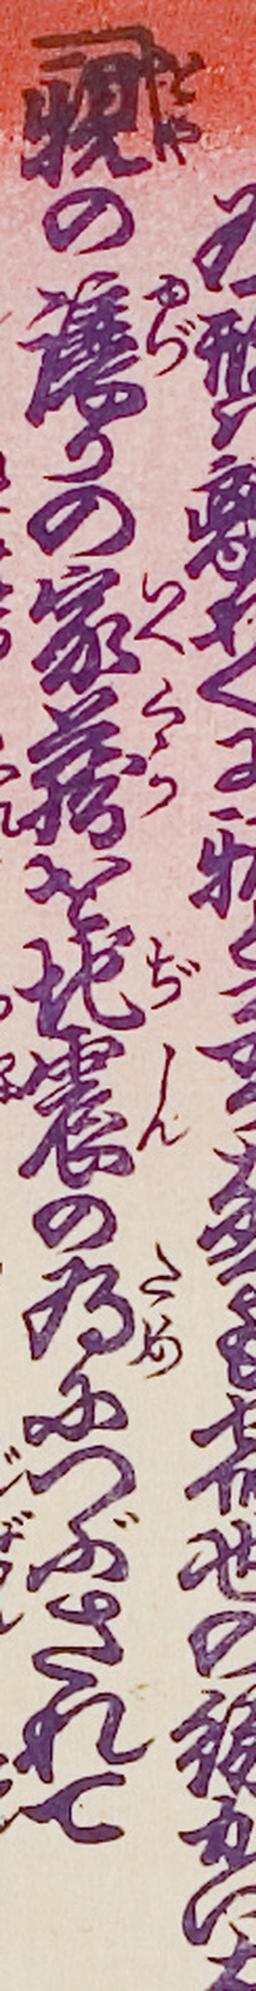〽親の譲りの家蔵を地震の為につぶされて
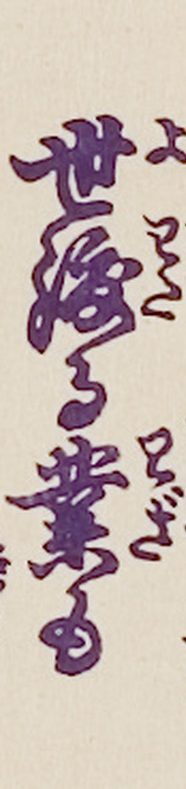世渡る業も
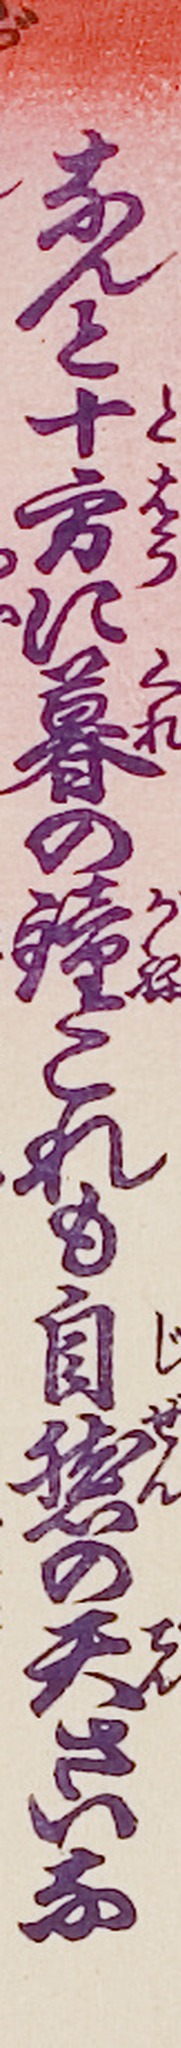なんと十方に暮の鐘これも自然の天さいな
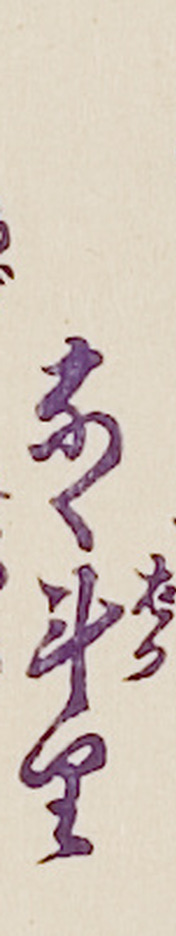なく斗り
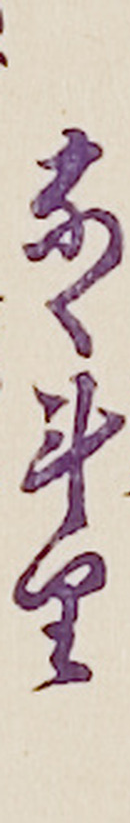なく斗り
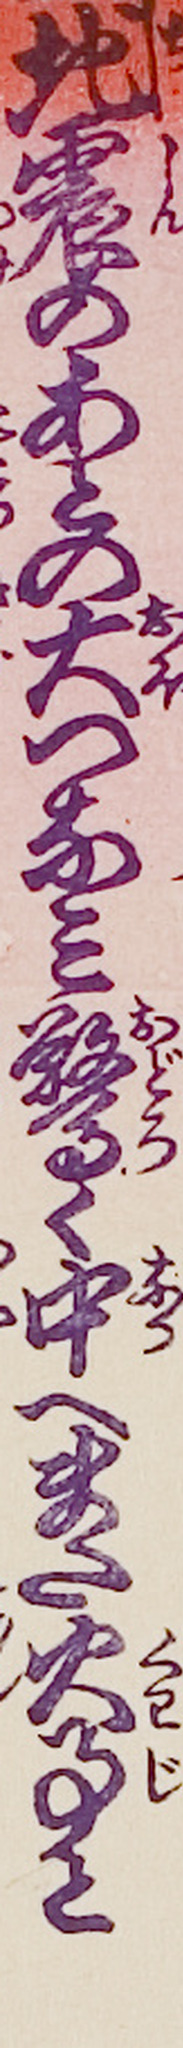〽地震のあとの大つなみ驚く中へまた火事と
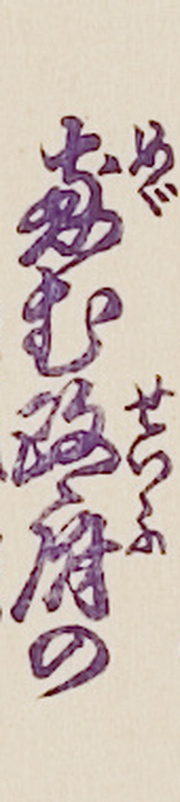恵む政府の
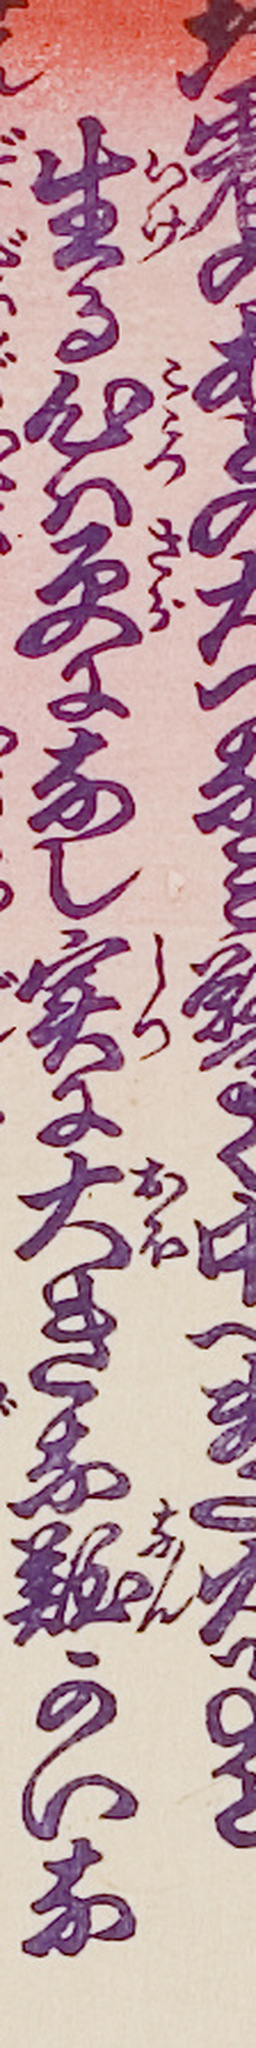生る心は更になし実に大きな難かいな
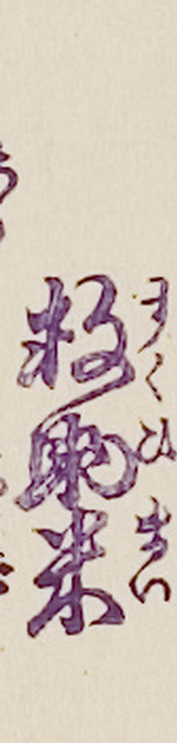救助米
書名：北陸三県大つなみ縁かいな節
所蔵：東京大学総合図書館 General Library in the University of Tokyo, JAPAN
